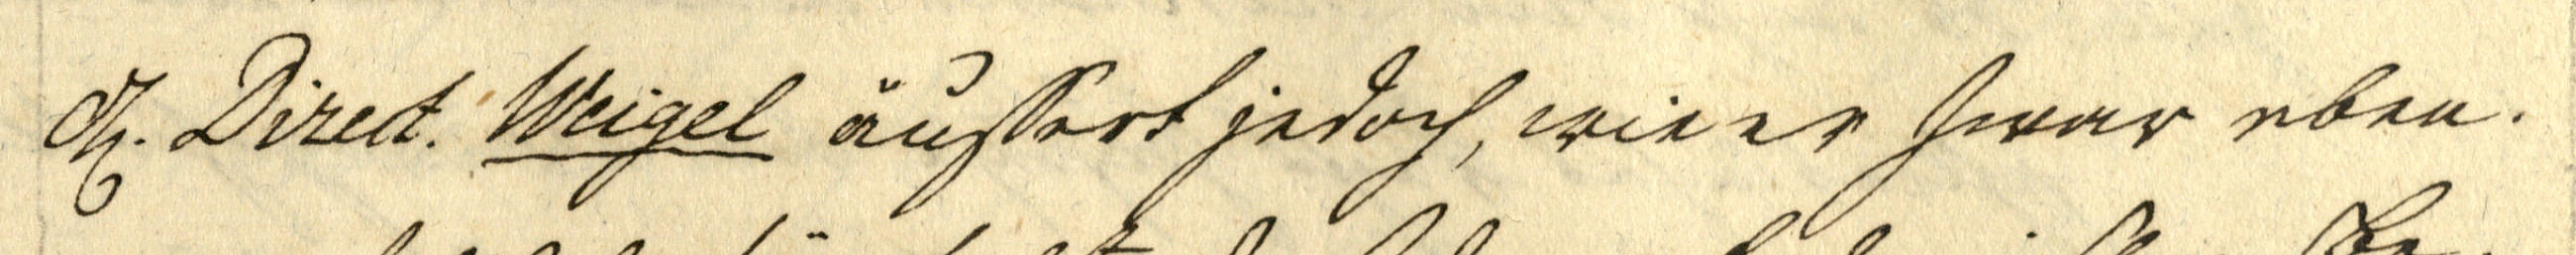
dh. Direct. Weigel äussert jedoch, wie er zwar eben¬
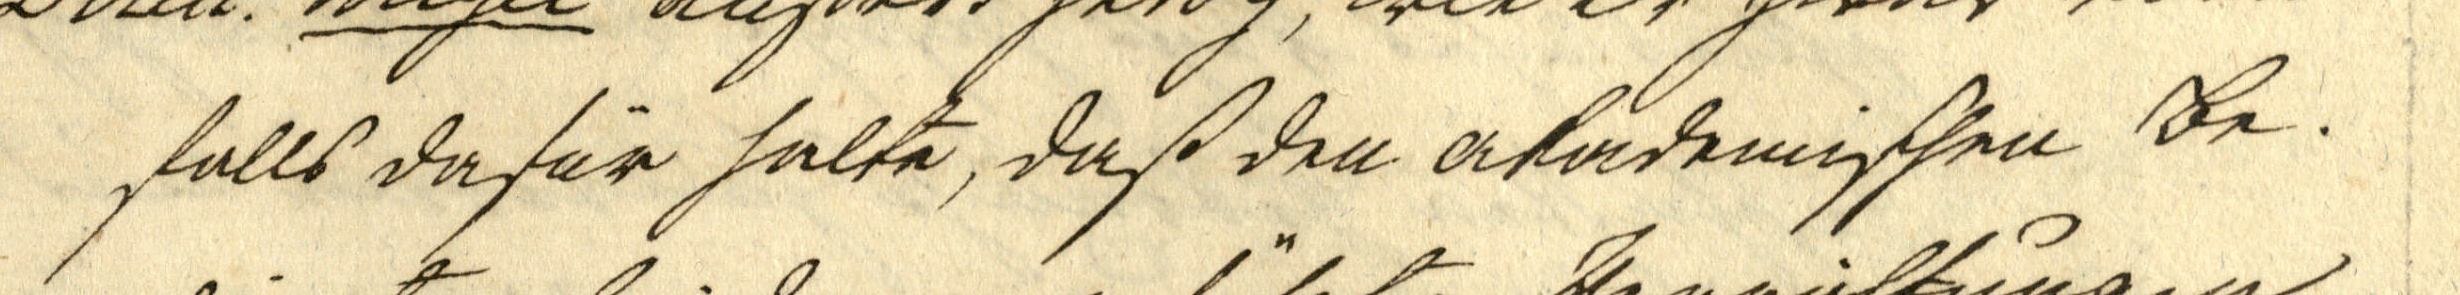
falls dafür halte, daß den akademischen Be¬
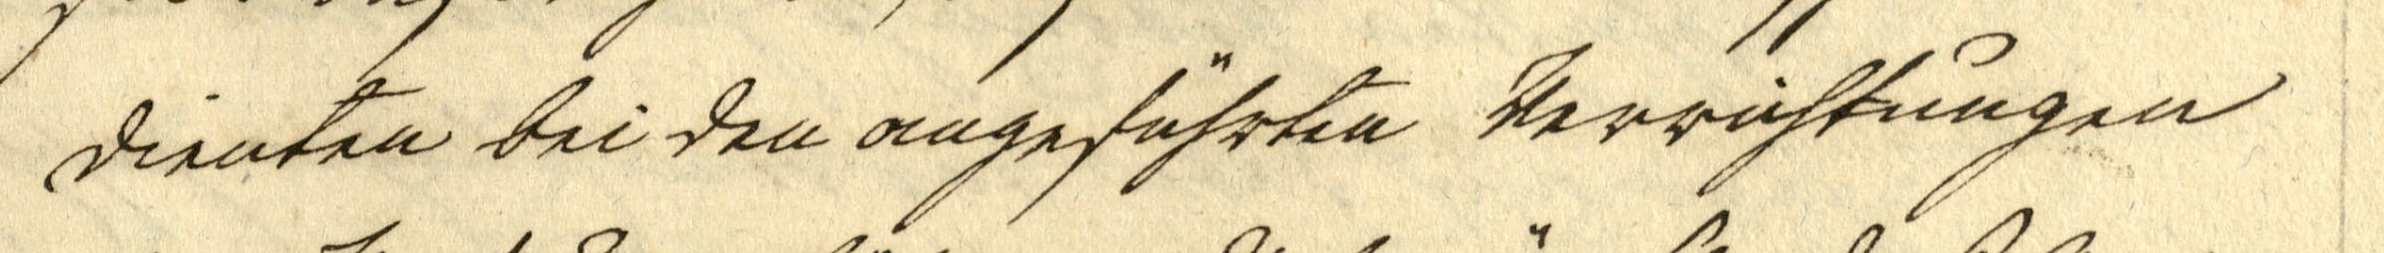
dienten bei den angeführten Verrichtungen
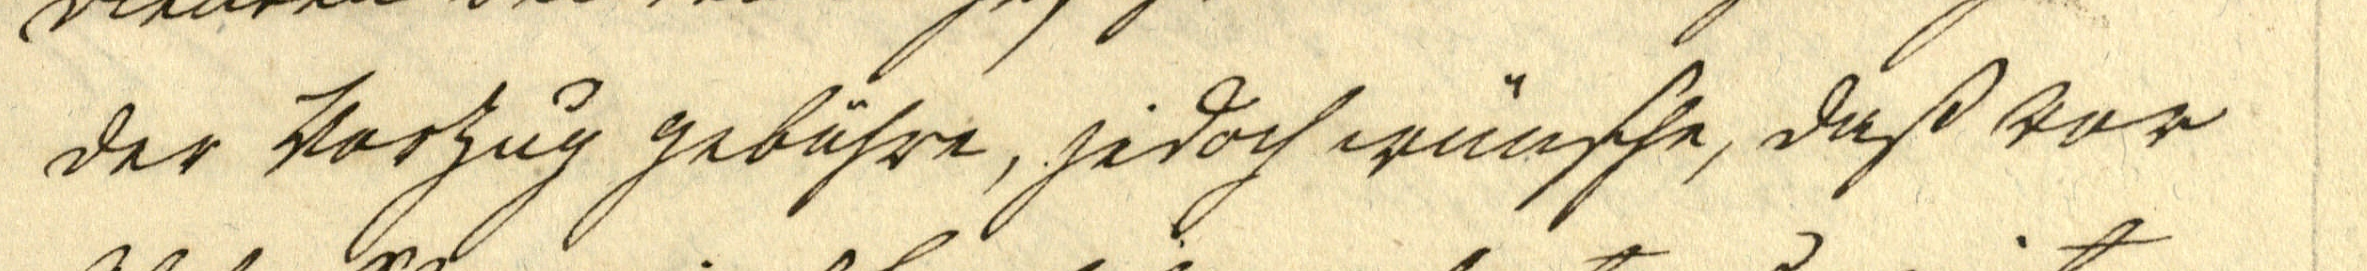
der Vorzug gebühre, jedoch wünsche, daß vor
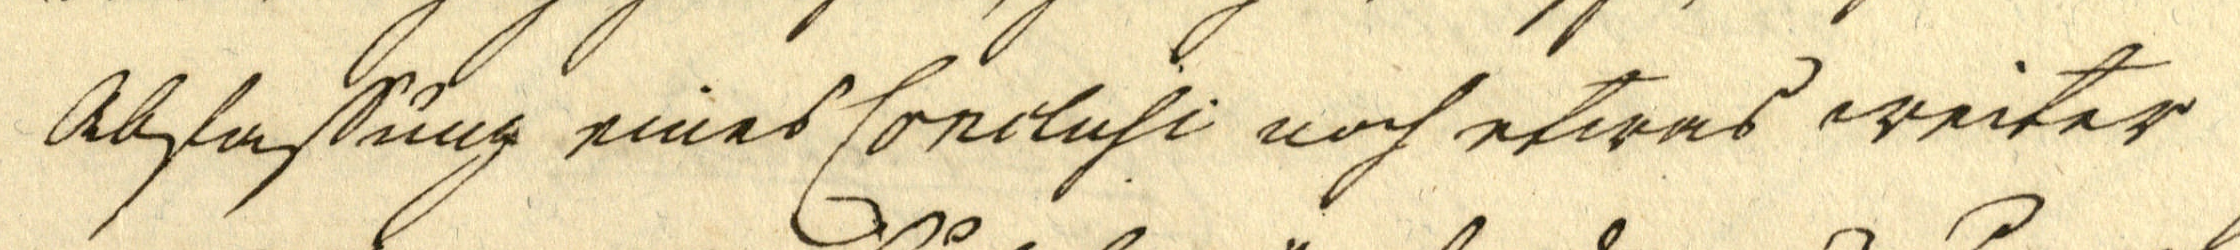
Abfassung eines Conclusi noch etwas weiter
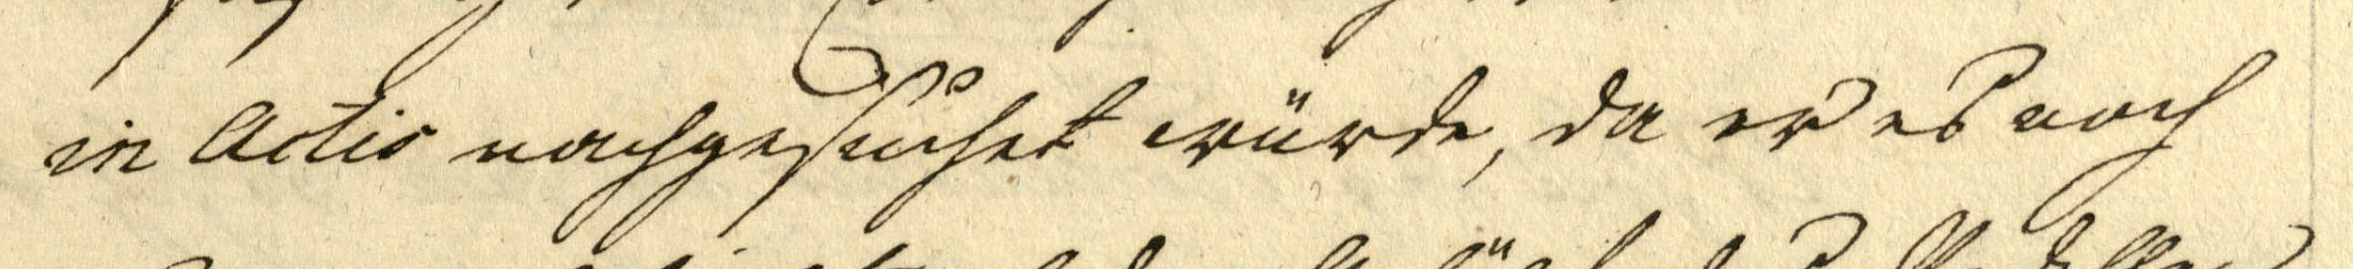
in Actis nachgesuchet würde, da er es noch
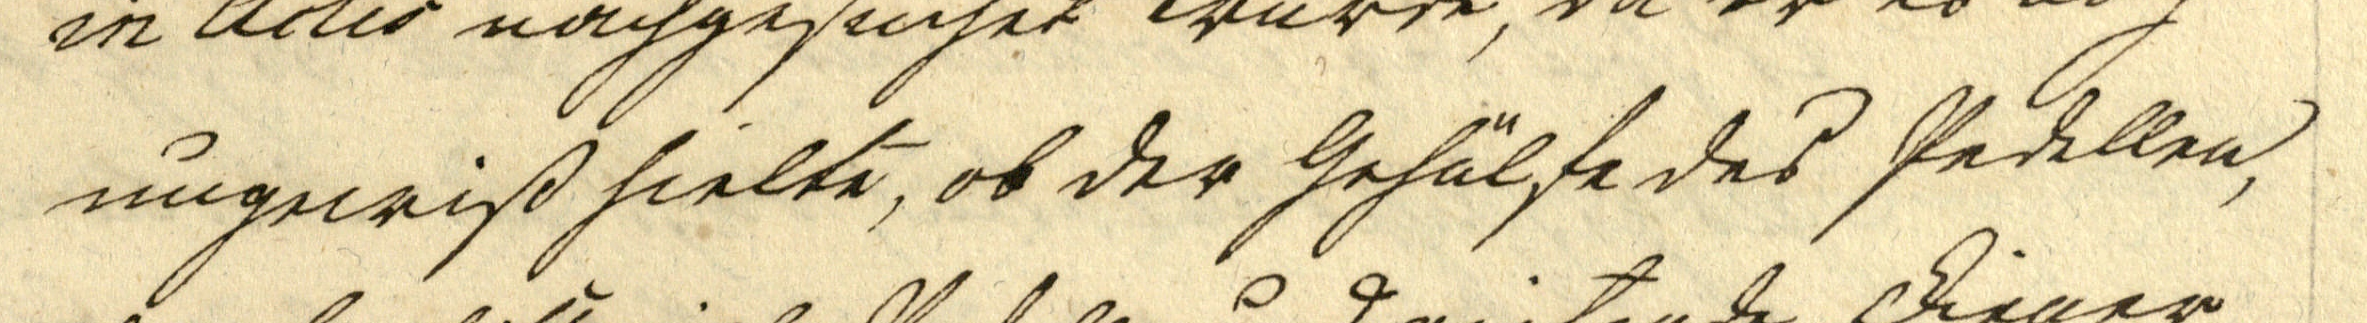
ungewiß hielte, ob der Gehülfe des Pedellen,
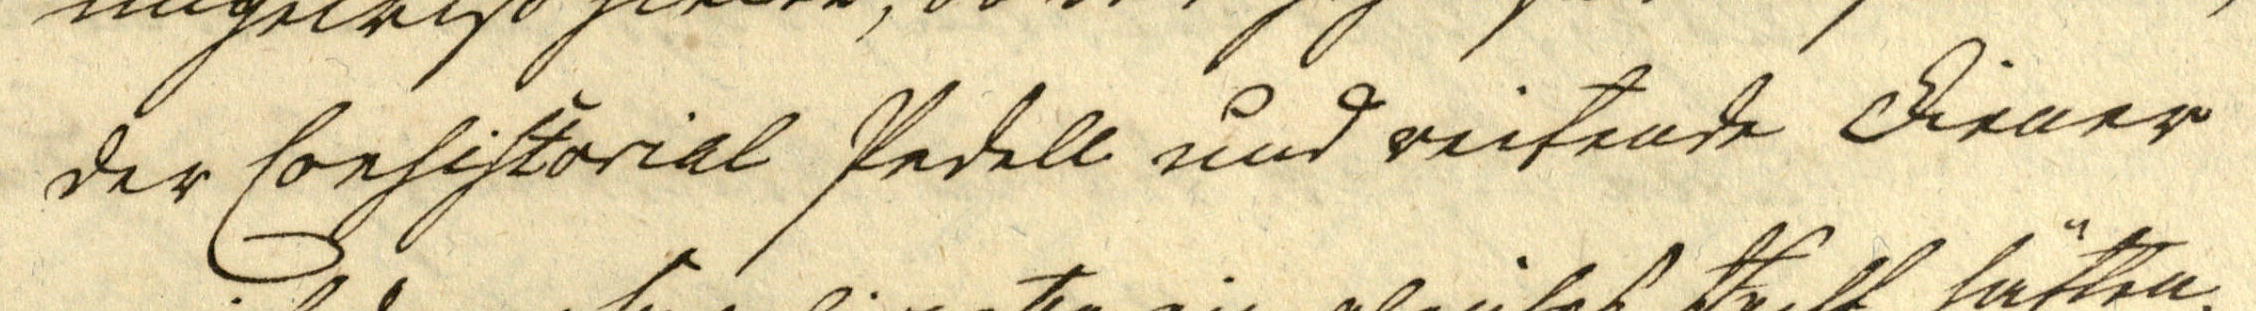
der Consistorial Pedell und reitende Diener
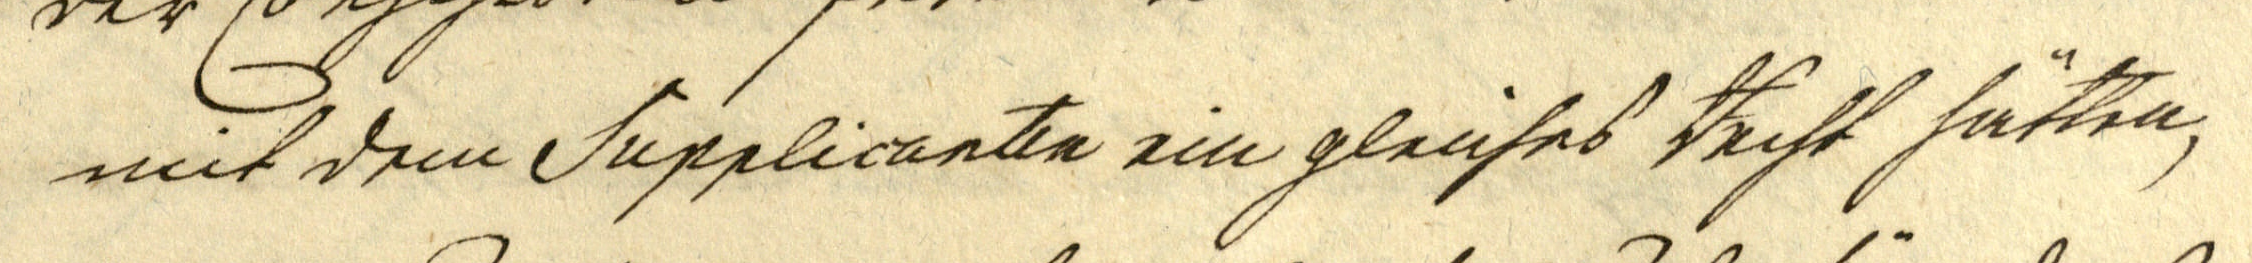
mit dem Supplicanten ein gleiches Recht hätten.
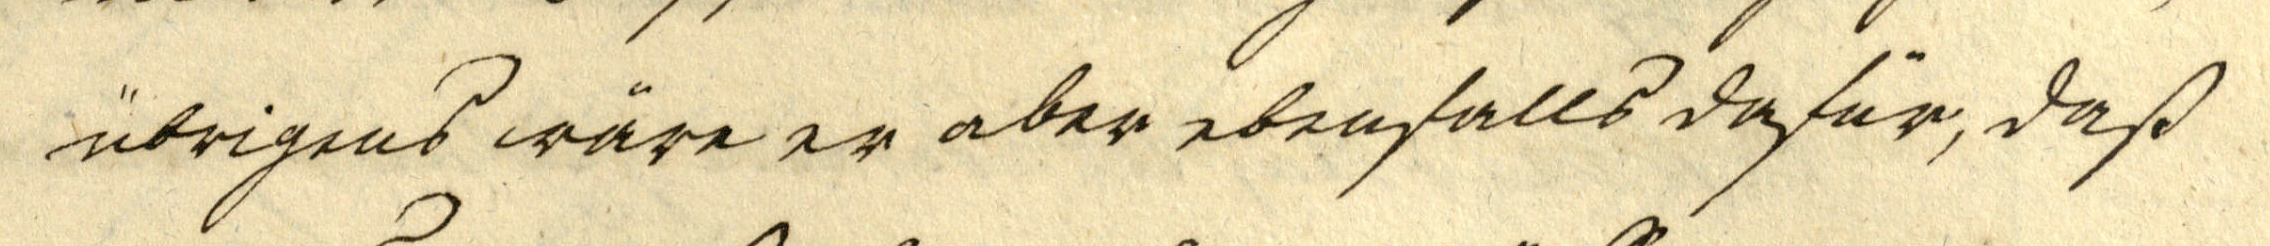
übrigens wäre er aber ebenfalls dafür, daß
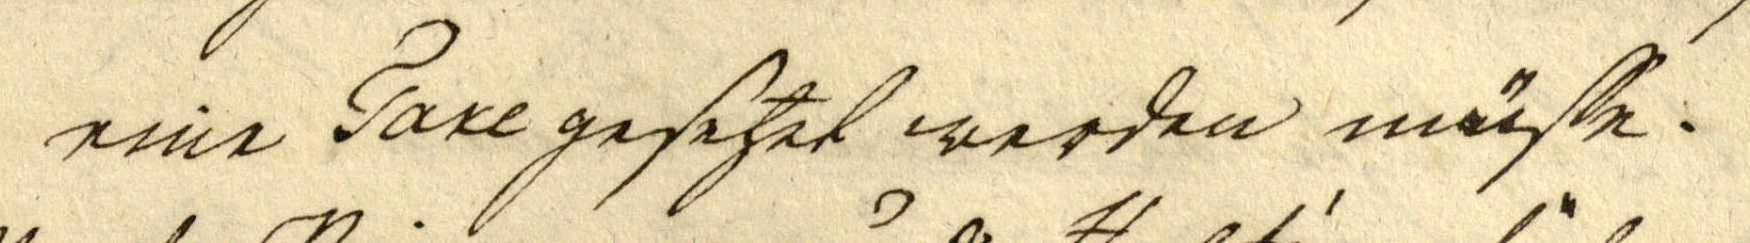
eine Taxe gesetzet werden müsse.
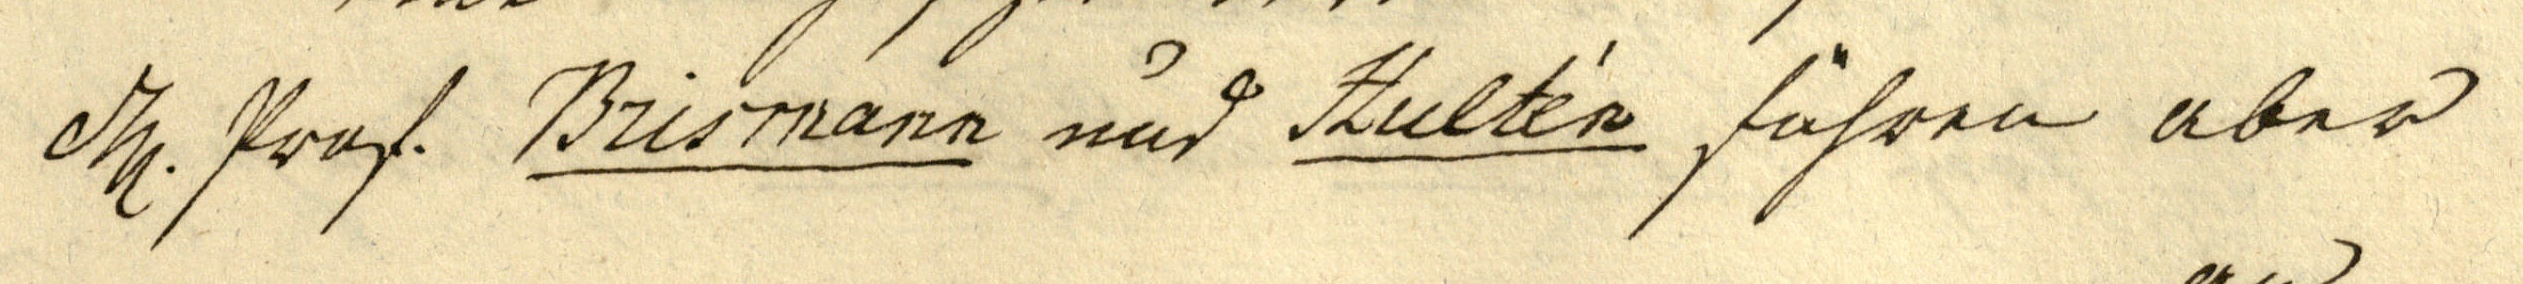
dh. Prof. Brismann und Hultén führen aber
